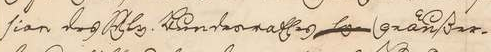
sion des Schw. Bundesrathes we geäußer-
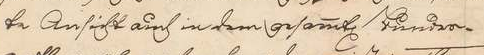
te Ansicht auch in dem gesammten Bundes-
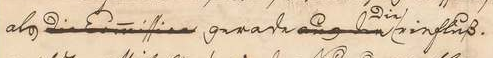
als die Commission gerade aus dendie einfluß-
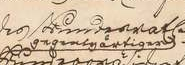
des Bundesrathes,
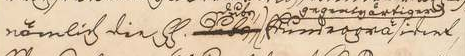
nämlich die HH. DubsDubs,gegenwärtiger Bundespräsident,
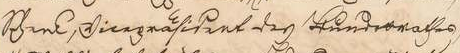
Schenk, Vicepräsident des Bundesrathes,
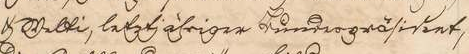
& Welti, letztjähriger Bundespräsident,
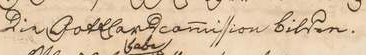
die Gotthardcommission bilden.
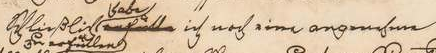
Schließlich erfüllehabe ich noch eine angenehme
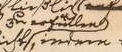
Pflicht zu
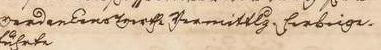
verdankenswerthe Vermittlg. herbeige-
